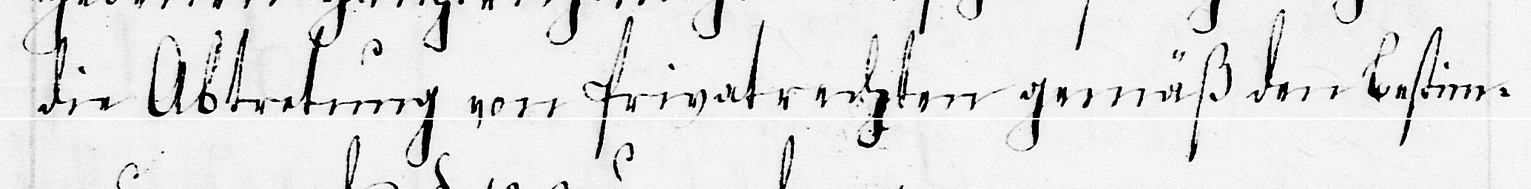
die Abtretung von Privatrechten gemäß den Bestim¬
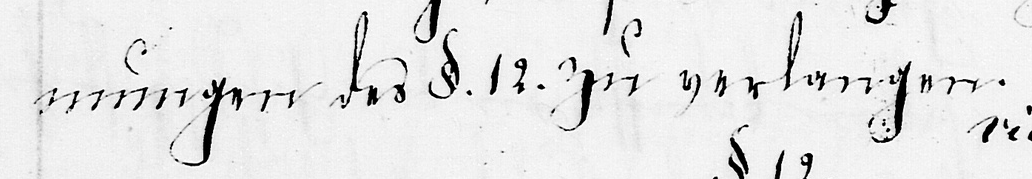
mungen des §. 12. zu verlangen.
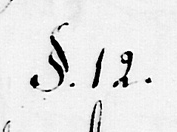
§. 12.
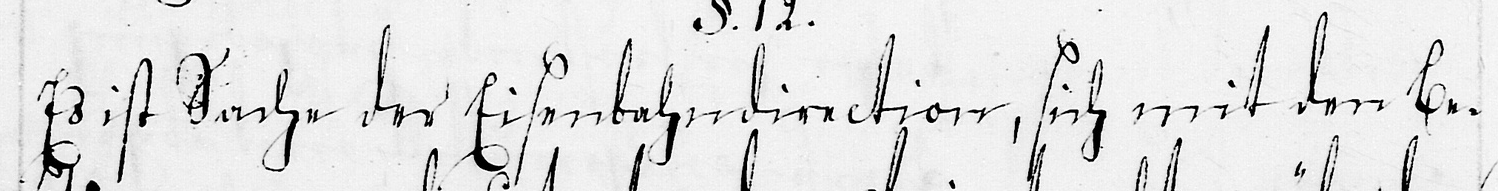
Es ist Sache der Eisenbahndirection, sich mit den Be¬
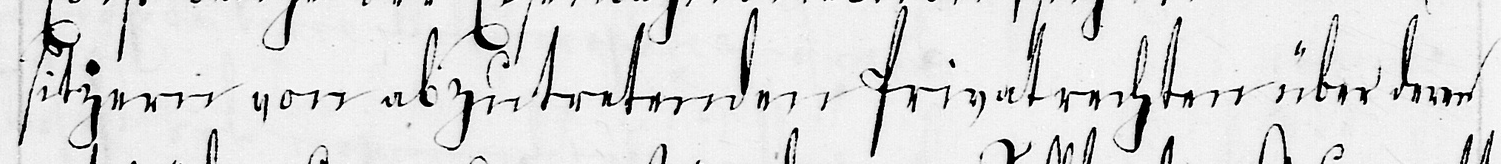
sitzern von abzutretenden Privatrechten über deren
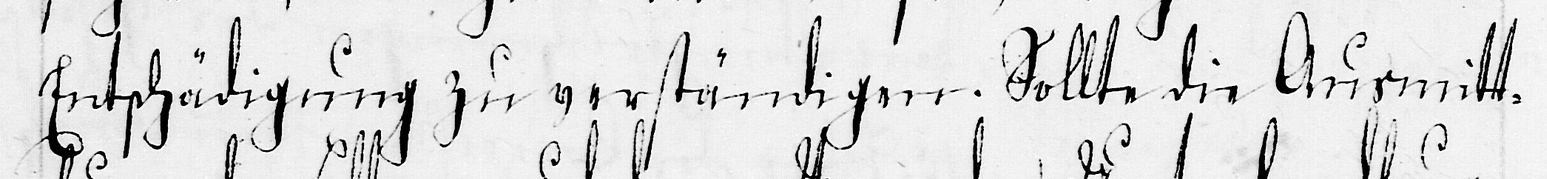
Entschädigung zu verständigen. Sollte die Ausmitt¬
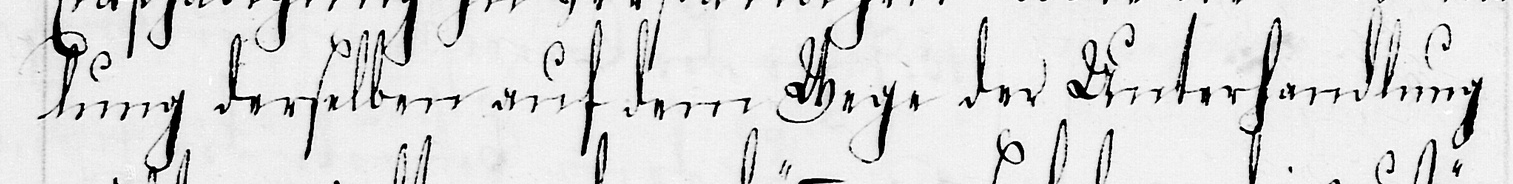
lung derselben auf dem Wege der Unterhandlung
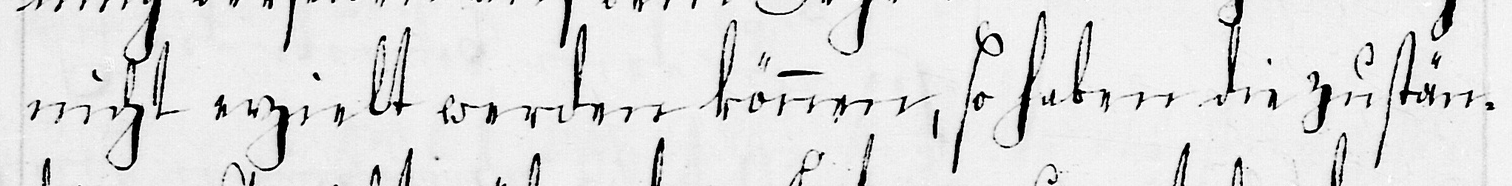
nicht erzielt werden können, so haben die zustän¬
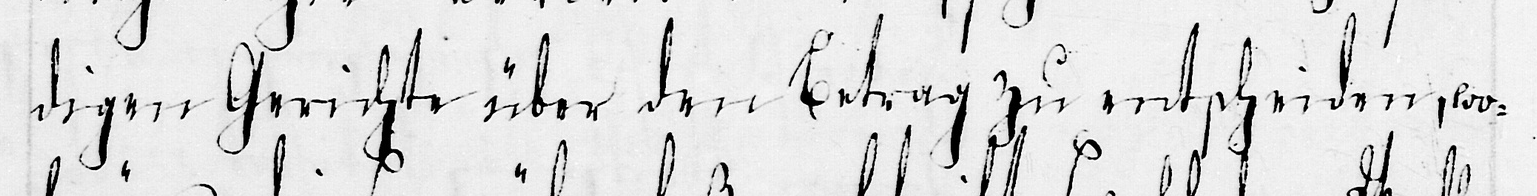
digen Gerichte über den Betrag zu entscheiden, wo¬
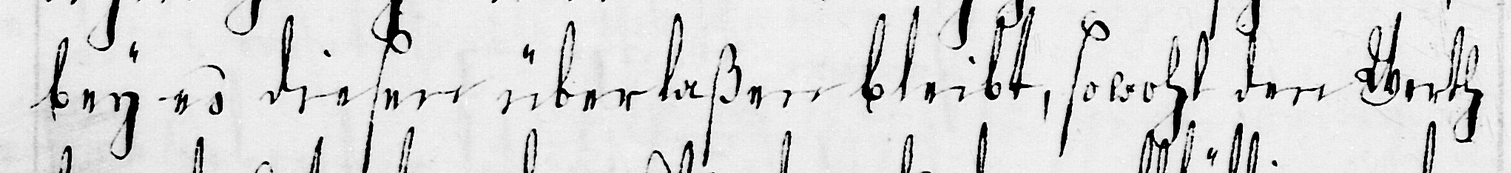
bey es diesen überlaßen bleibt, sowohl den Werth
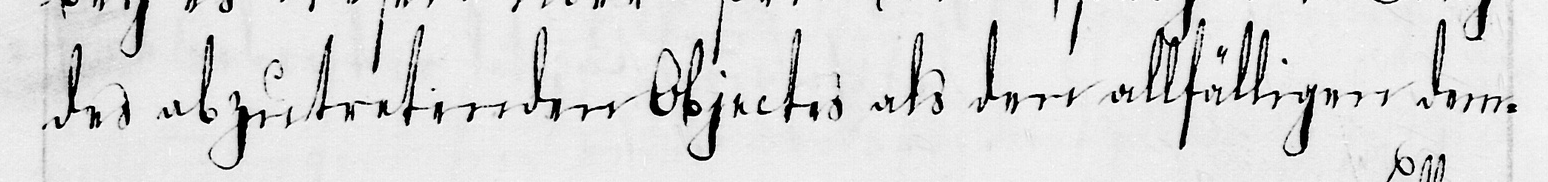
des abzutretenden Objectes als den allfälligen dem-
